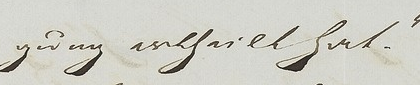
gung ertheilt hat.»
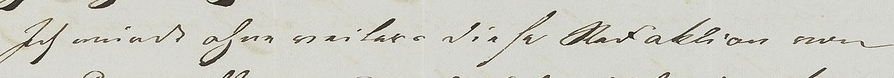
Ich würde ohne weiters diese Redaktion von
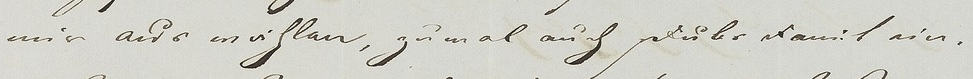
mir aus wählen, zumal auch Dubs damit ein-
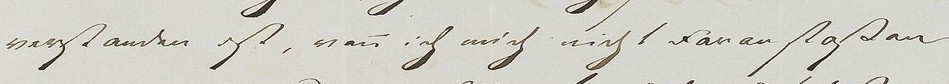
verstanden ist, wenn ich mich nicht daran stoßen
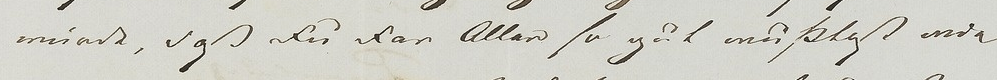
würde, daß du das Alles so gut wußtest wie
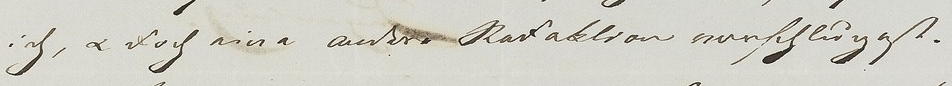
ich, & doch eine andere Redaktion vorschlugest.
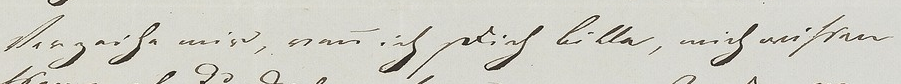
Verzeihe mir, wenn ich Dich bitte, mich wissen
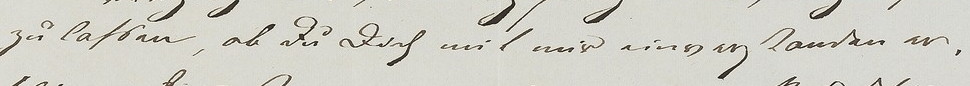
zu lassen, ob Du Dich mit mir einverstanden er-
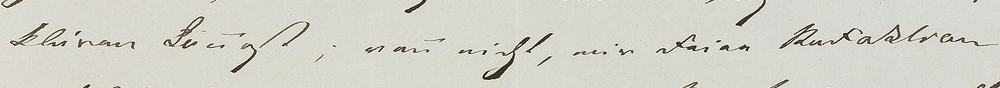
klären könnest; wenn nicht, mir deine Redaktion
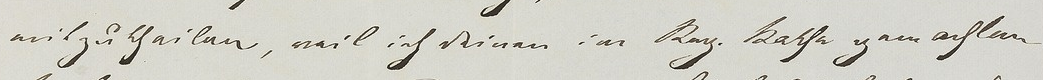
mitzutheilen, weil ich deinen im Reg.Rathe gemachten
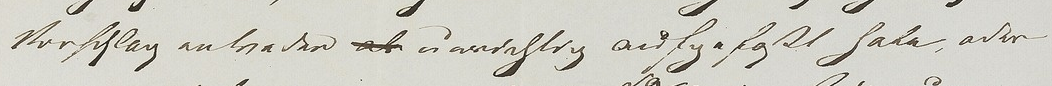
Vorschlag entweder ab unrichtig aufgefaßt habe, oder
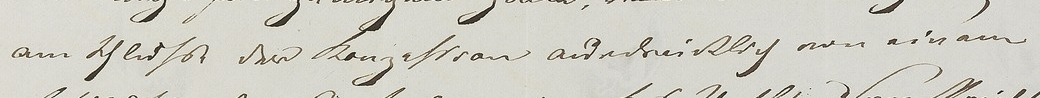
am Schlusse der Konzession ausdrücklich von einem
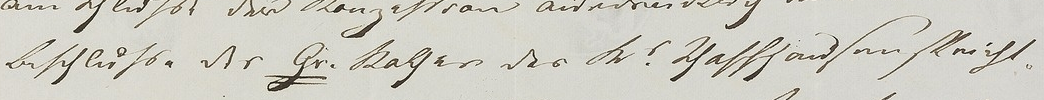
Beschlusse des Gr. Rathes des KsSchaffhausen spricht.
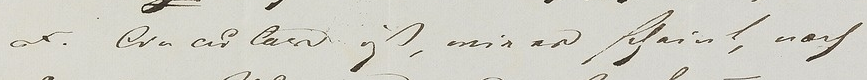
D. Circular ist, wie es scheint, noch
